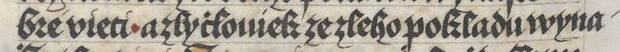bre vieci.a zly ċlouiek ze zleho pokladu wyna¬
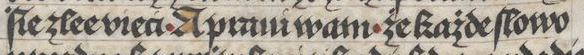ẛíe zlee vieci.A praui wam.że każde ſlowo
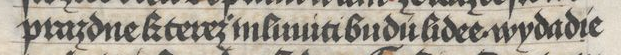prazdne ktereż mluuiti budú lidee.wydadíe
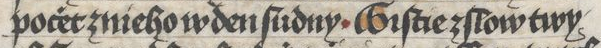počet znieho wden ſudny.Giſtie zſlow twy¬
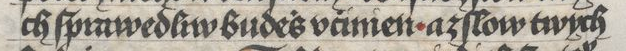ch ſprawedliw budeṡ vċinien.a zſlow twych
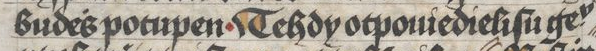budeṡ potupen.Tehdy otpouiedieli ſu gev
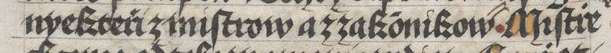nyekteří z miſtrow a z zakōnikow.Miſtṙe
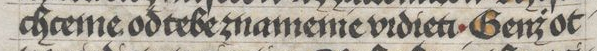chceme odtebe znameníe vidieti.Genż ot¬
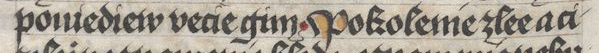pouiediew vecie gim.Pokolenie zlee a ci¬
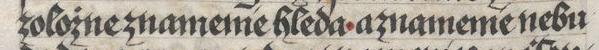zolożne znameníe hleda.aznameníe nebu¬
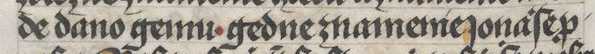de dano gemu.gedne znamenie Ionaẛe ꝓ
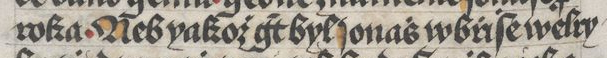roka.Neb yakoż ḡt byl Ionaṡ wbṙiẛe welry¬
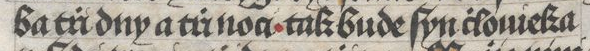ba tṙi dny a tṙi noci.tak bude ſyn ċlouieka
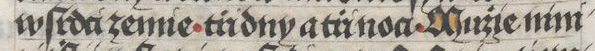wſrdci zemie.tṙi dny a tṙi noci.Mużie nimi
